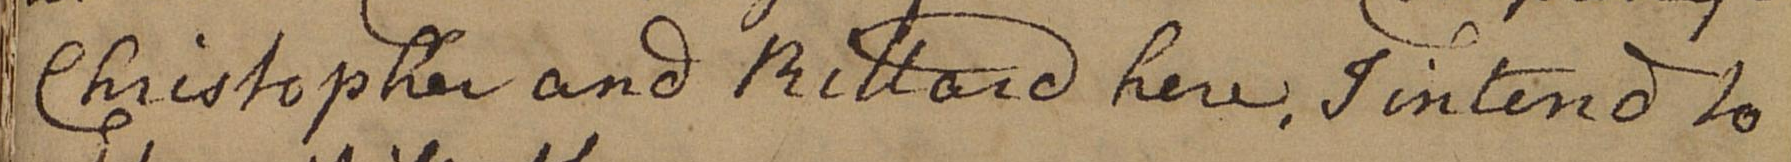Christopher and Rittard here, I intend to
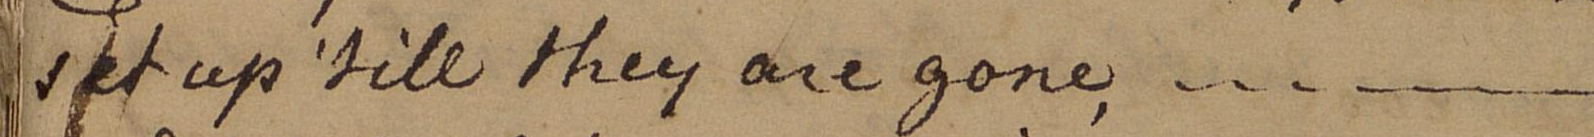set up till they are gone--
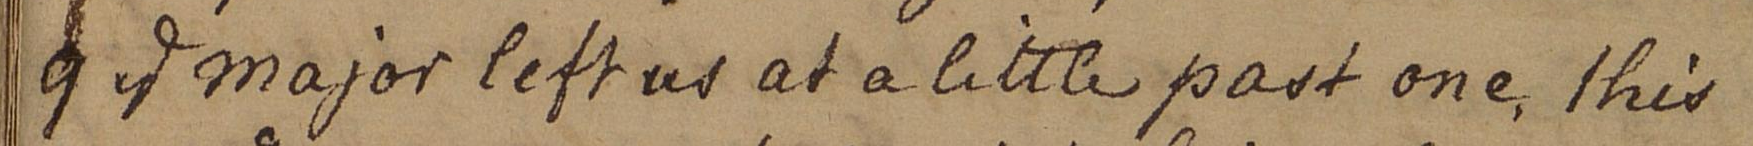9 y^e major left us at a little past one, this
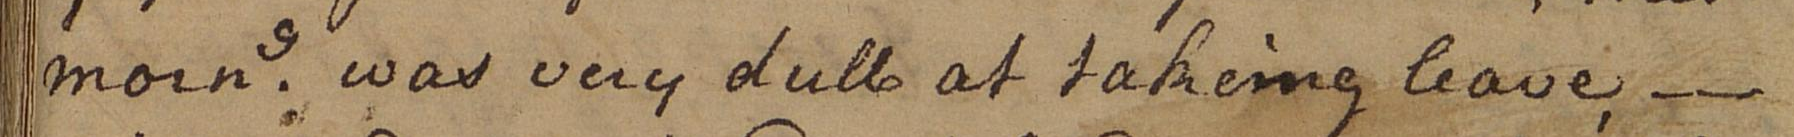morn^g. was very dull at takeing leave-
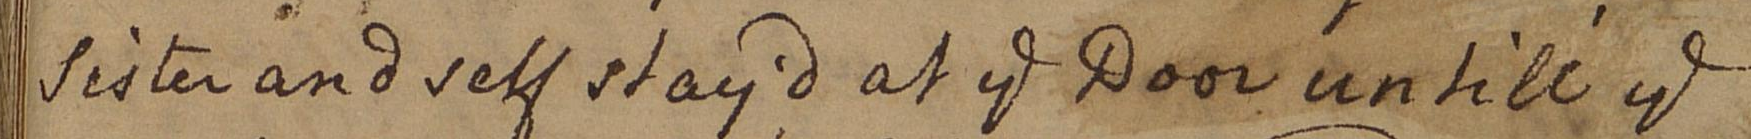Sister and self stay'd at y^e Door untill y^e
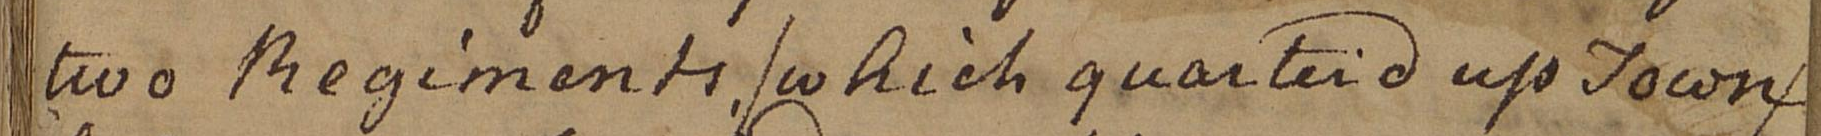two Regiments, /which quarter'd up Town/
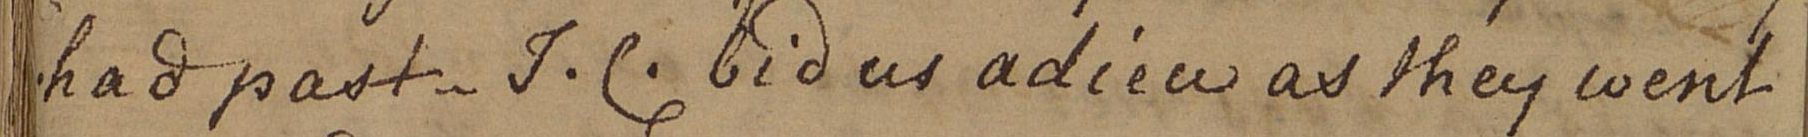had past- T. C. bid us adieu as they went
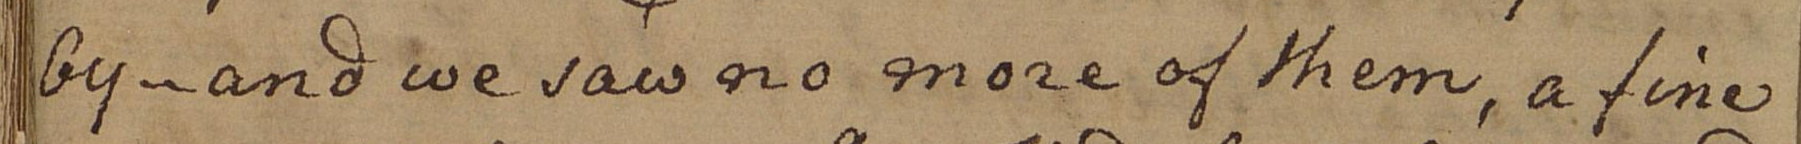by- and we saw no more of them, a fine
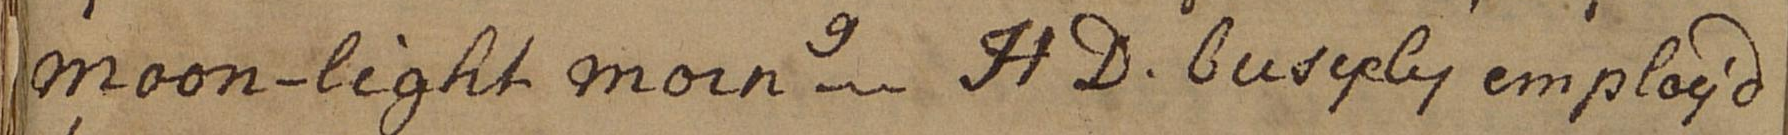moon- light morn^g- H D. busyely employ'd
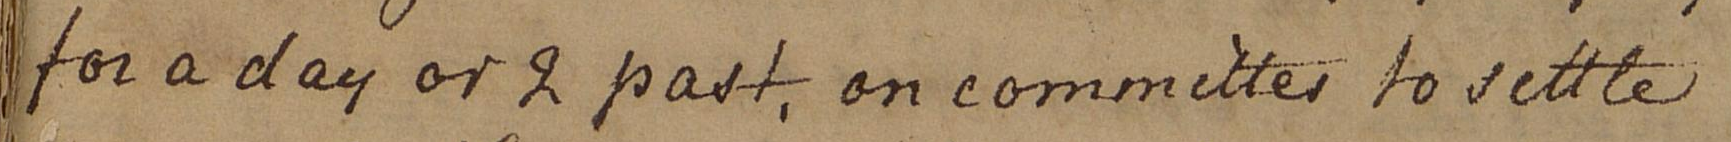for a day or 2 past, on committes to settle
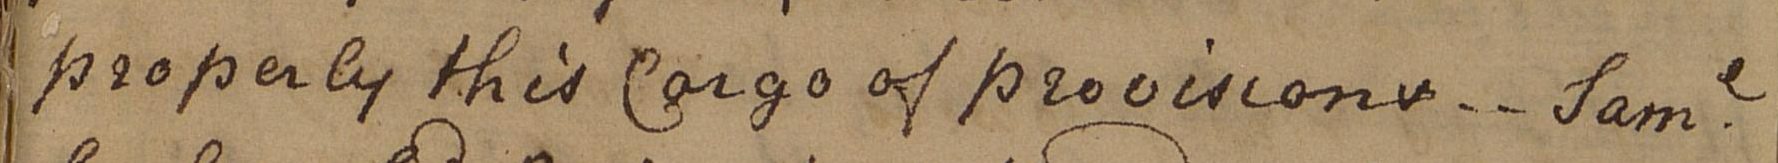properly this Cargo of provisions-- Sam.^l
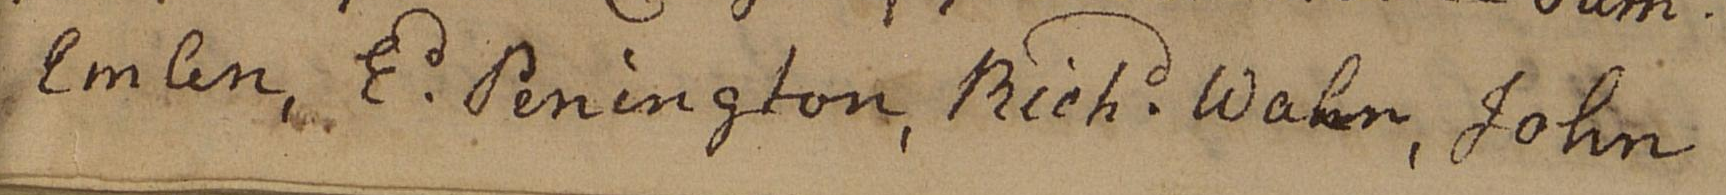Emlen, E^d. Penington, Rich^d. Waln, John
